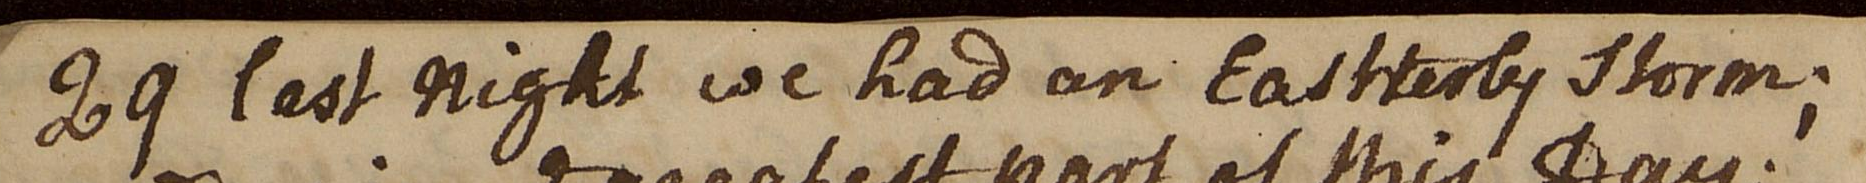29 last night we had an Eastterly storm;
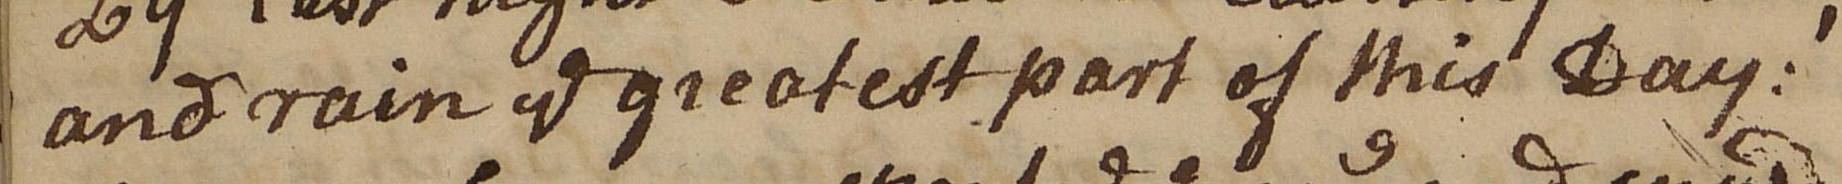and rain y^e greatest part of this Day:
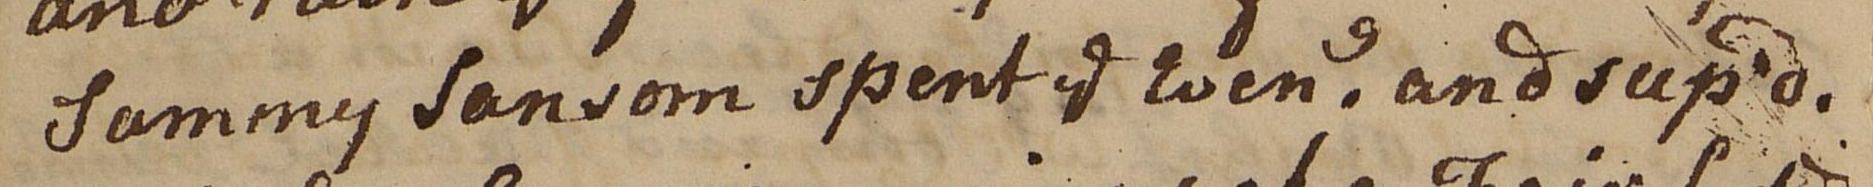Sammy Sansom spent y^e Even^g. and sup'd.
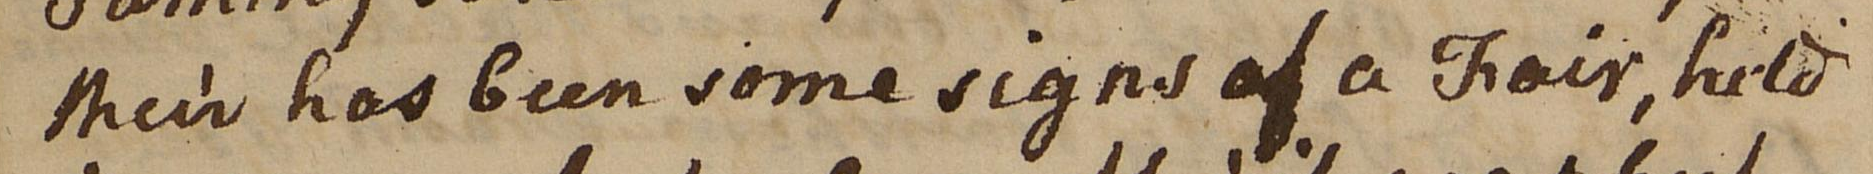their has been some signs of a Fair, held
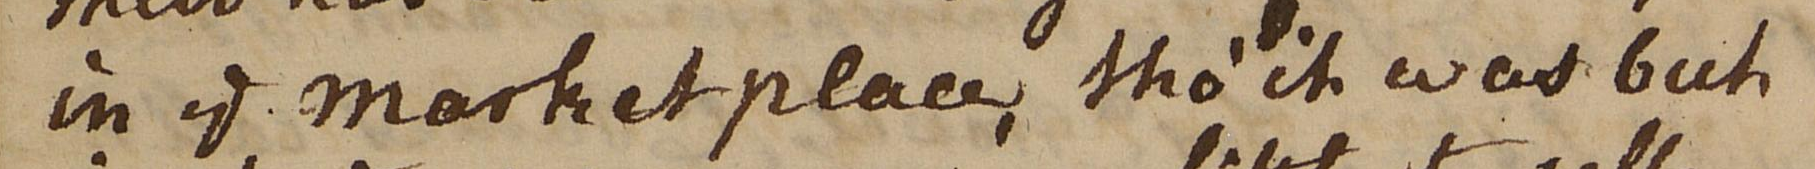in y^e market place, tho' it was but
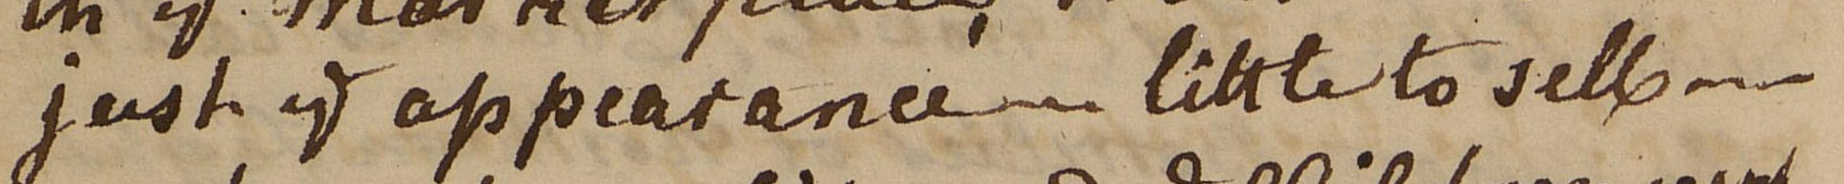just y^e appearance - little to sell -
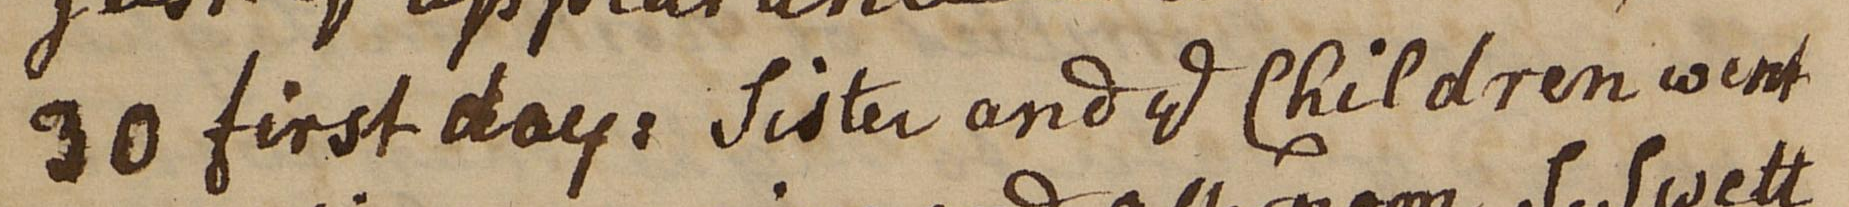30 first day: Sister and y^e Children went
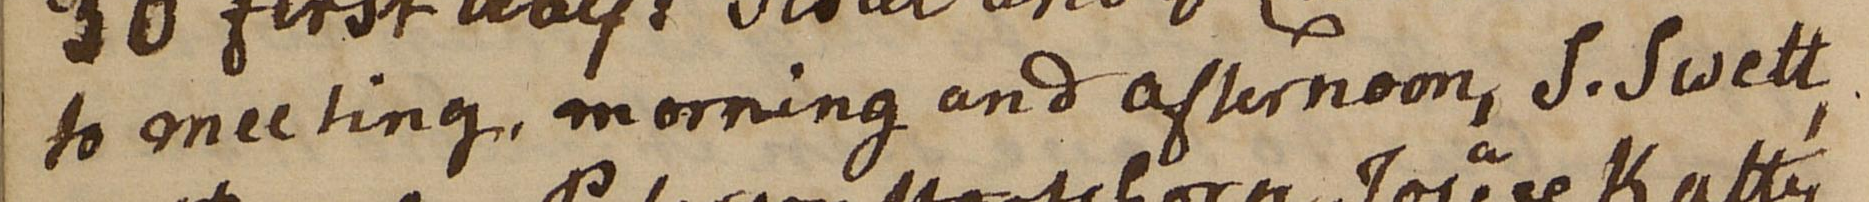to meeting, morning and afternoon, S Swett,
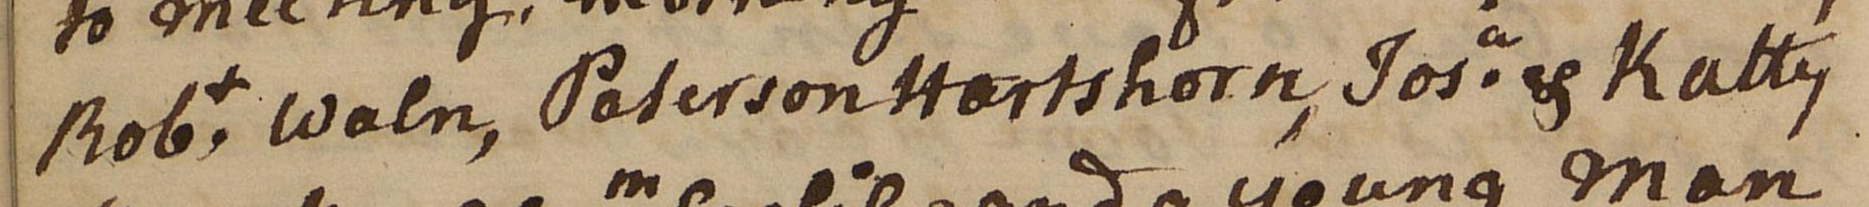Rob^t. Waln, Paterson Hartshorn, Jos^a. & Katty
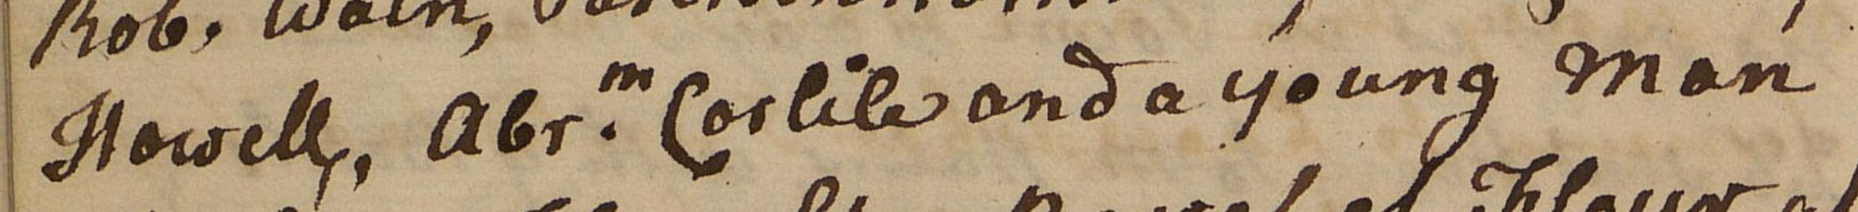Howell, Abr^m. Carlile and a young Man
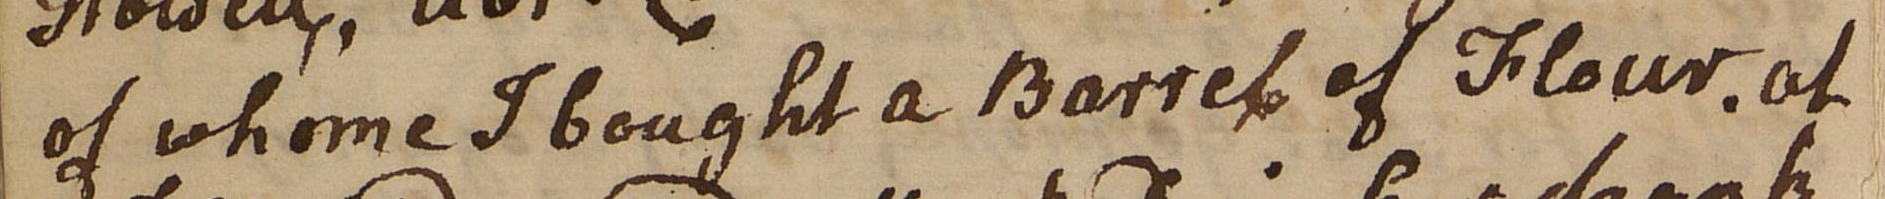of whome I bought a Barrel of Flour of
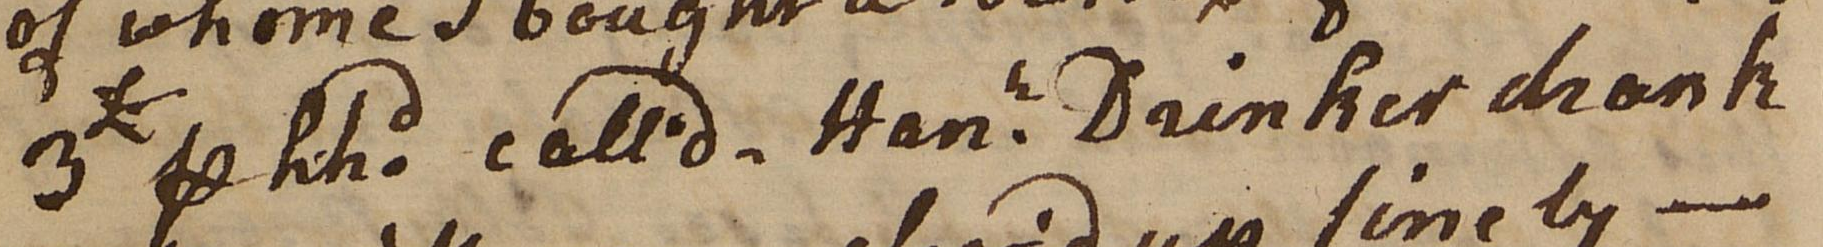3^£ per hh^d. call'd. Han^h. Drinker drank
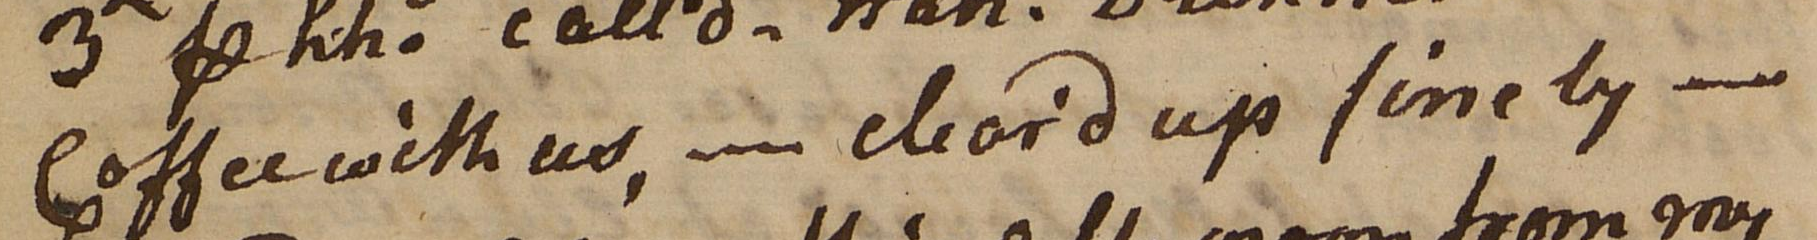Coffee with us,- cleard up finely-
